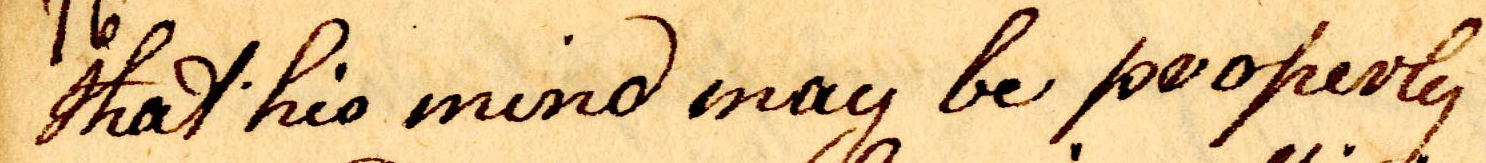that his mind may be properly
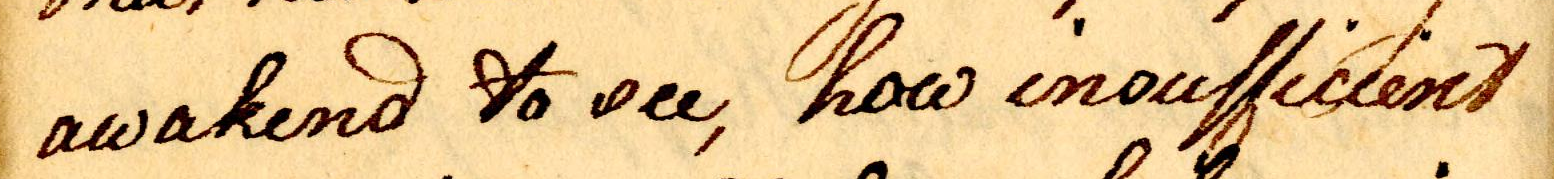awakend to see, how insufficient
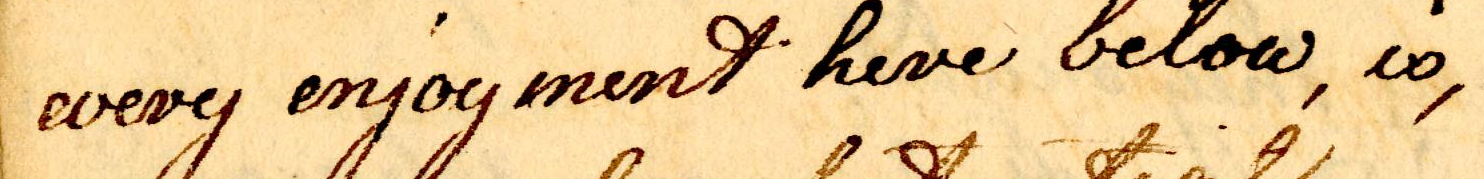every enjoyment here below, is,
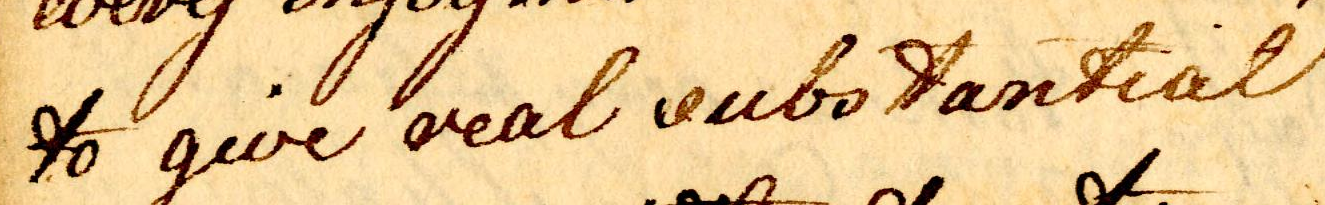to give real substantial
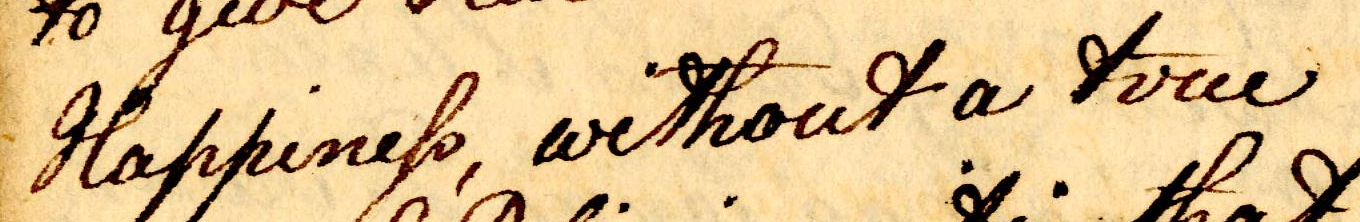Happiness, without a true
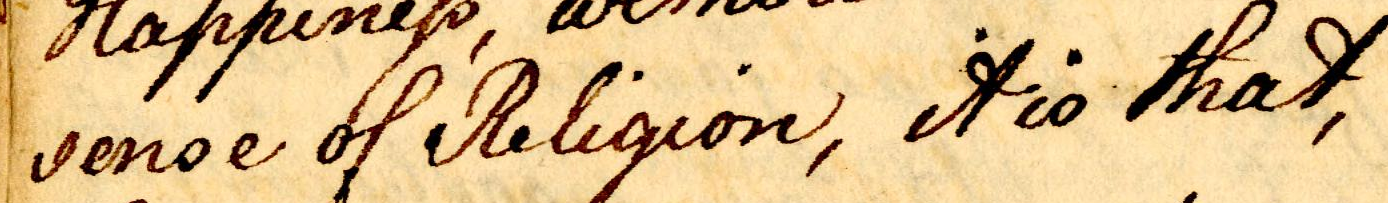sense of Religion, it is that,
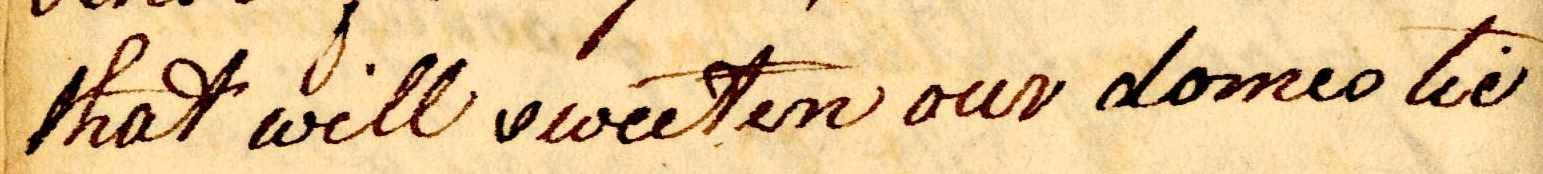that will sweeten our domestic
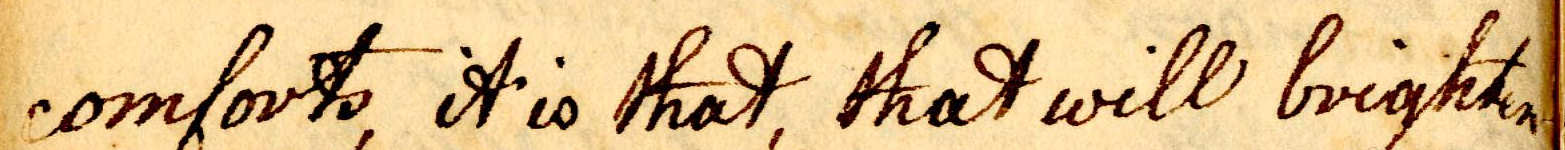comforts, it is that, that will brighten
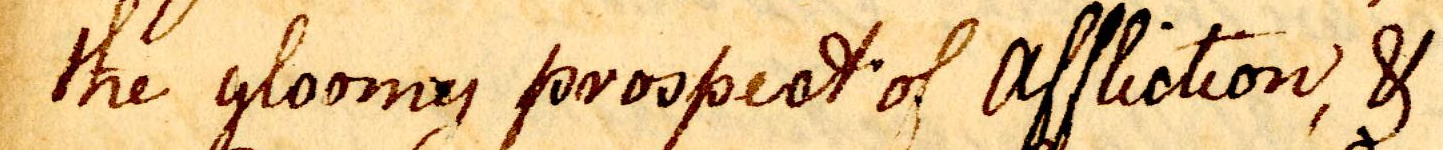the gloomy prospect of Affliction, &
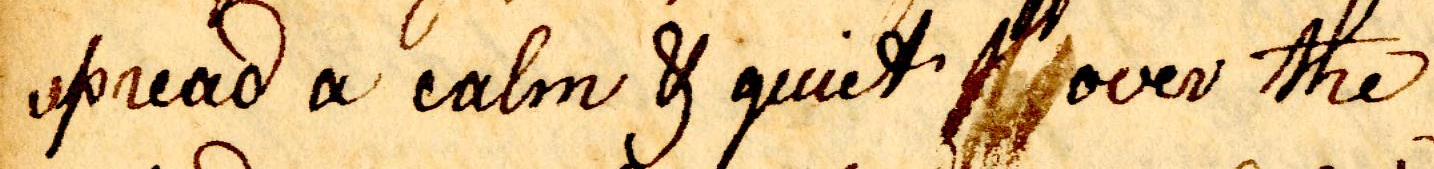spread a calm & quiet [__] over the
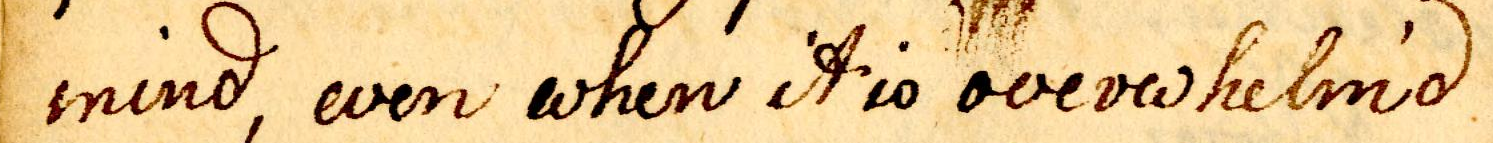mind, even when it is overwhelm'd
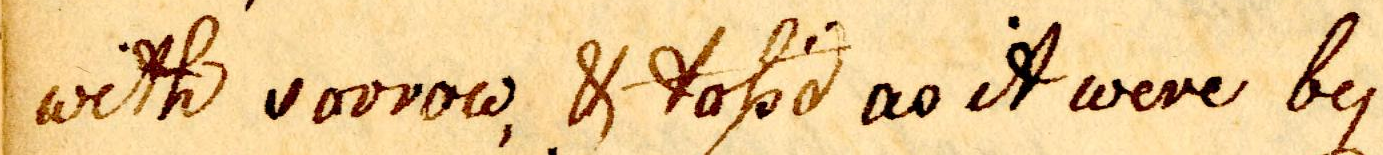with sorrow, & toss'd as it were by
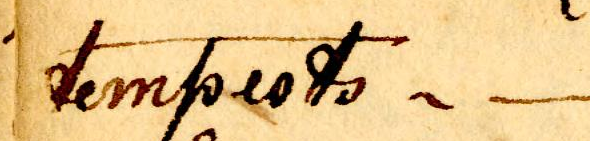tempests--
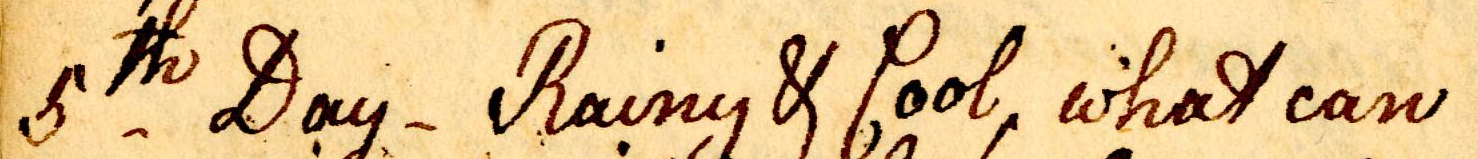5^th Day- Rainy & Cool, what can
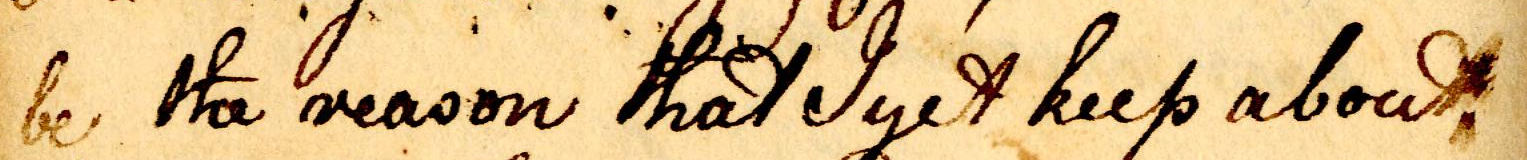be the reason that I yet keep about
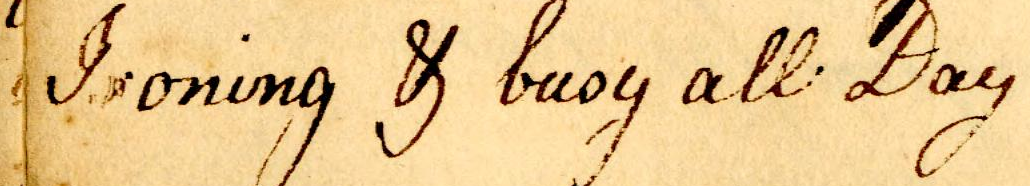Ironing & busy all Day
